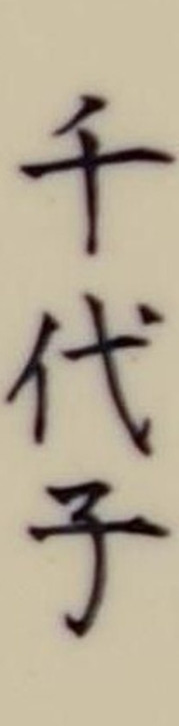千代子
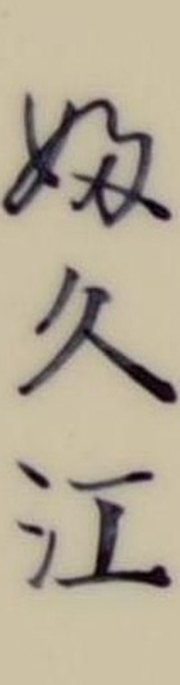ふ久江
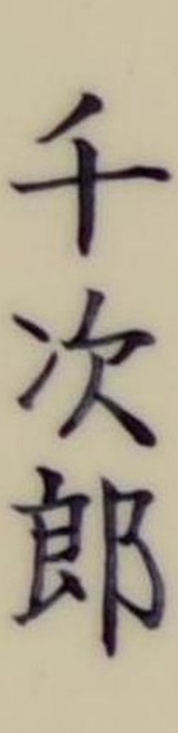千次郎
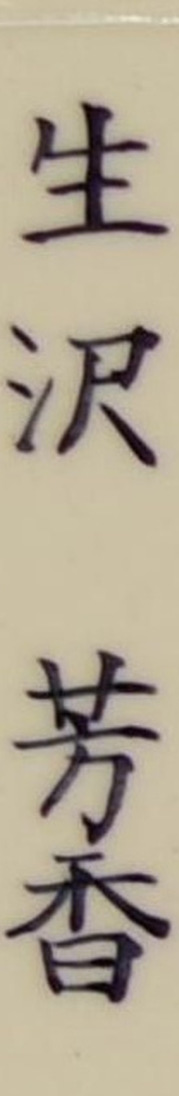生沢芳香
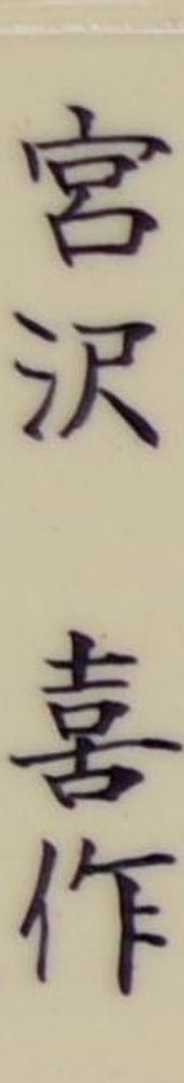宮沢喜作
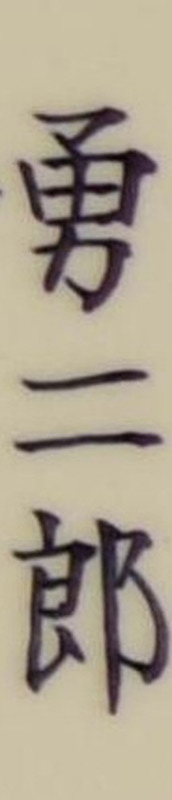勇二郎
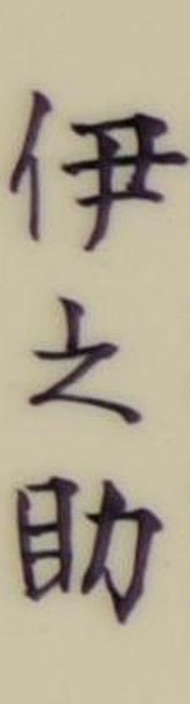伊之助
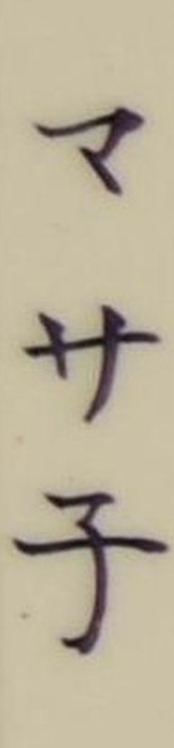マサ子

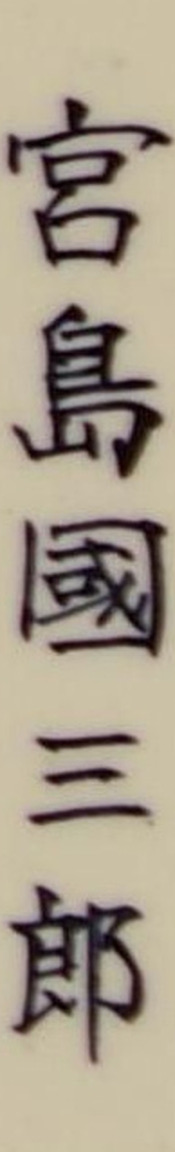宮島國三郎
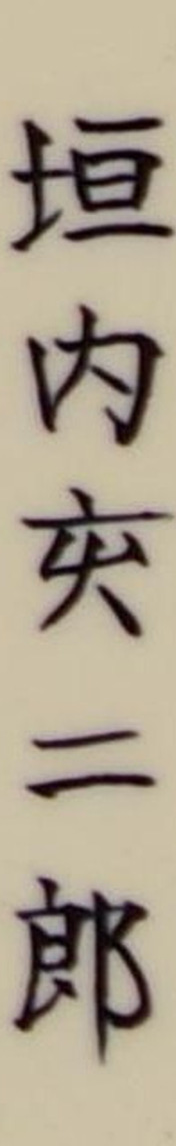垣内亥二郎
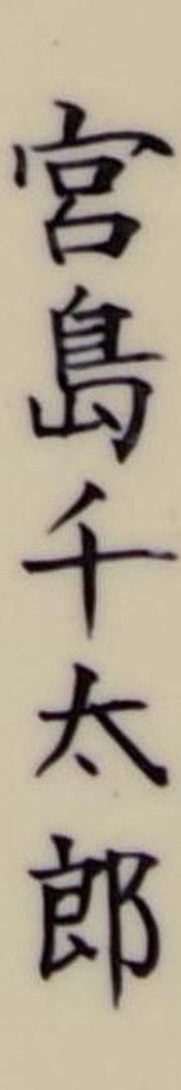宮島千太郎
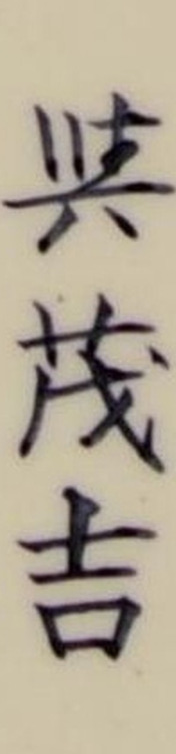与茂吉
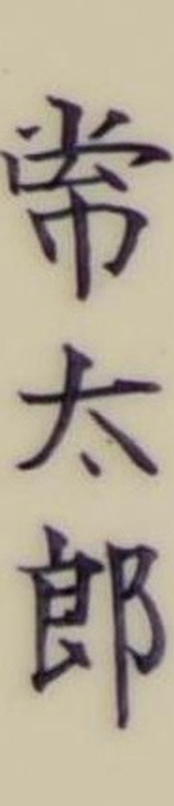常太郎
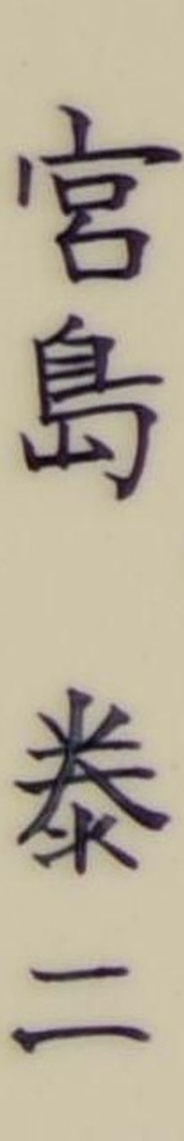宮島泰二

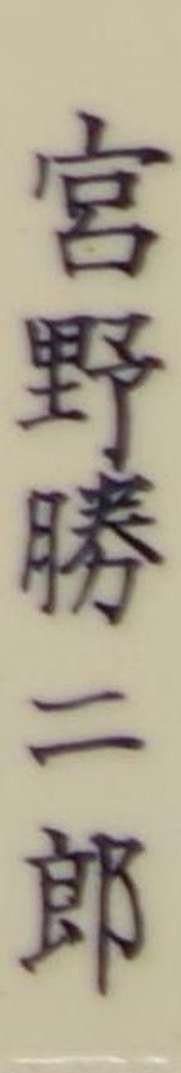宮野勝二郎
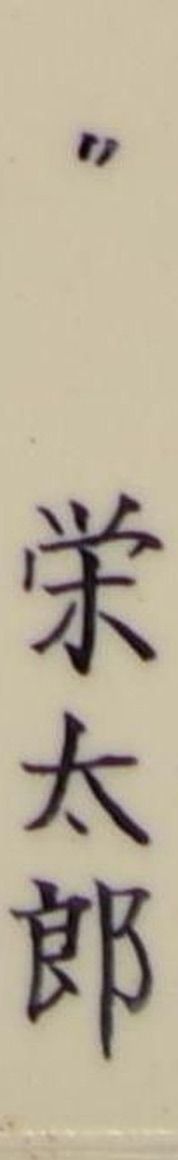栄太郎
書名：E~L
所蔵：高野山金剛峯寺
